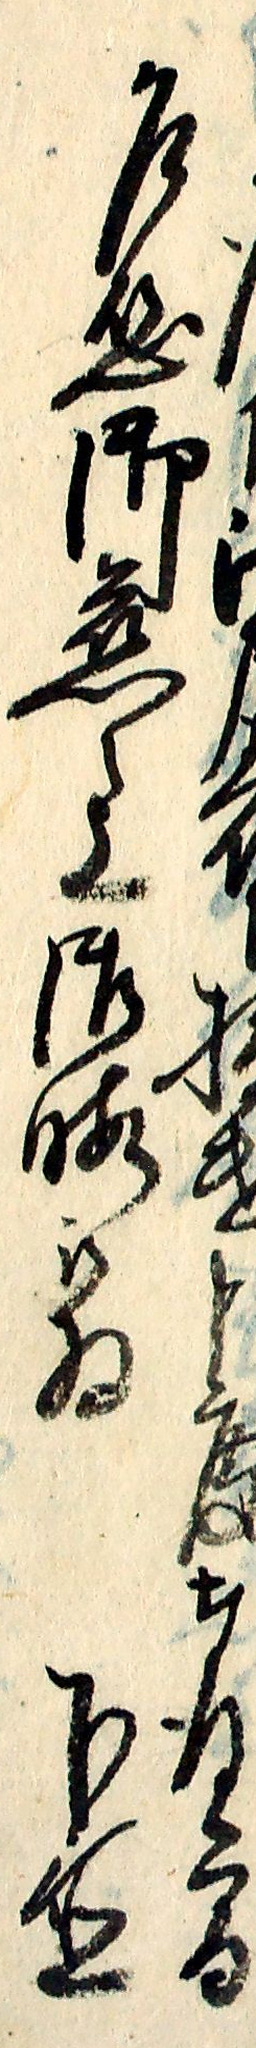乍恐御慈之上御暇被為下置

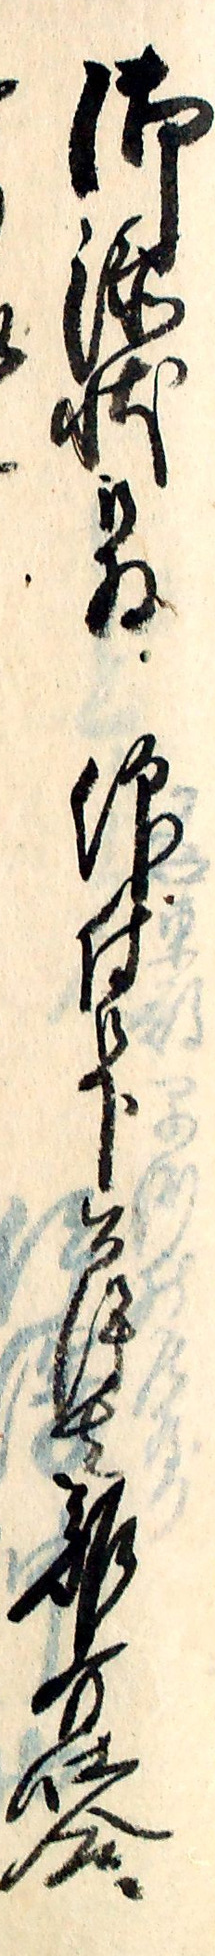御添状被為仰付被下候得は難有仕合に
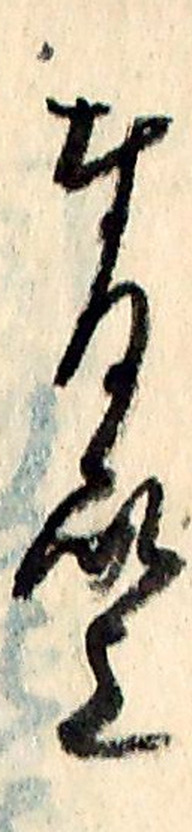奉存候以上
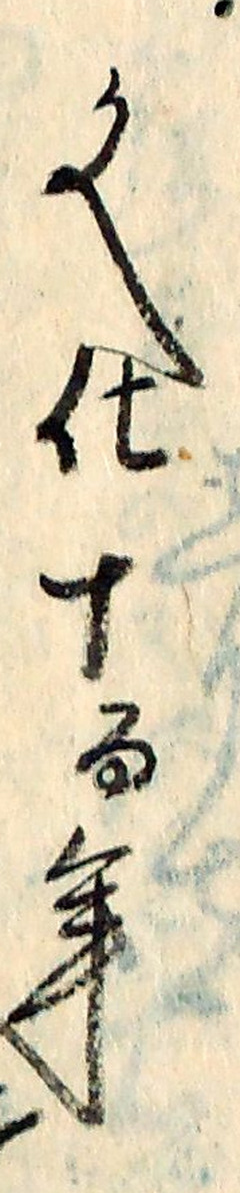文化十酉年
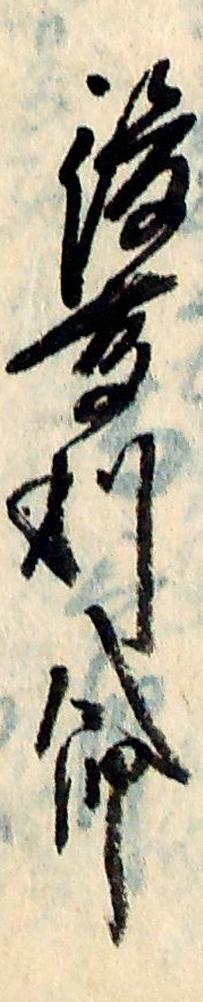後藤利八郎
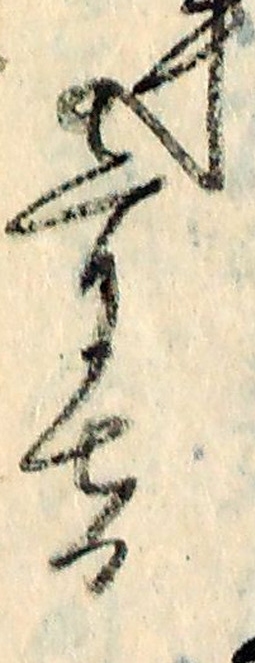十一月七日
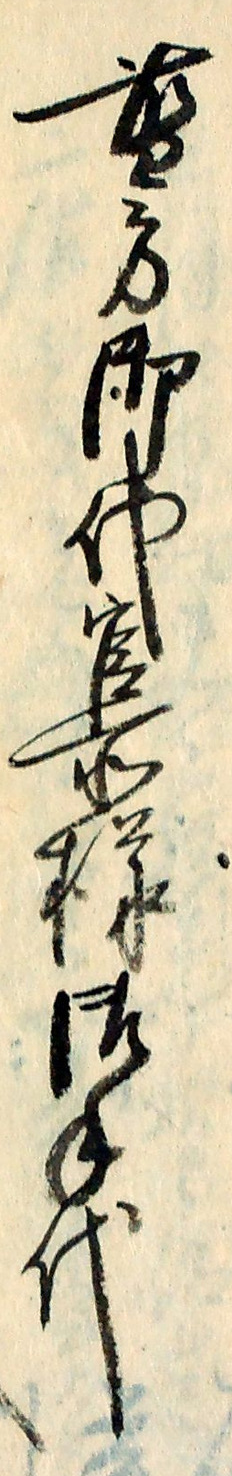藍方御代官所様御手代
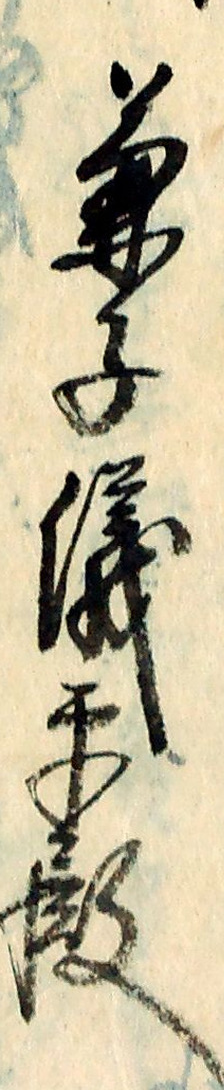兼子儀平殿
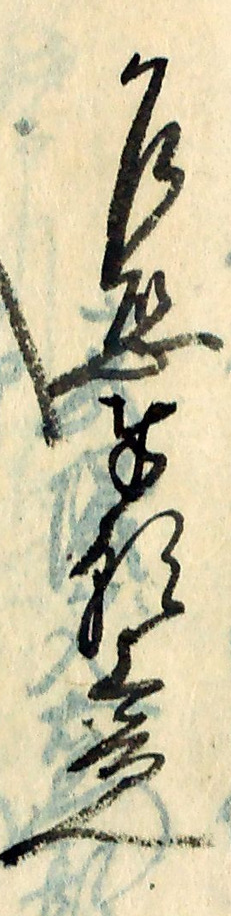乍恐奉願上覚
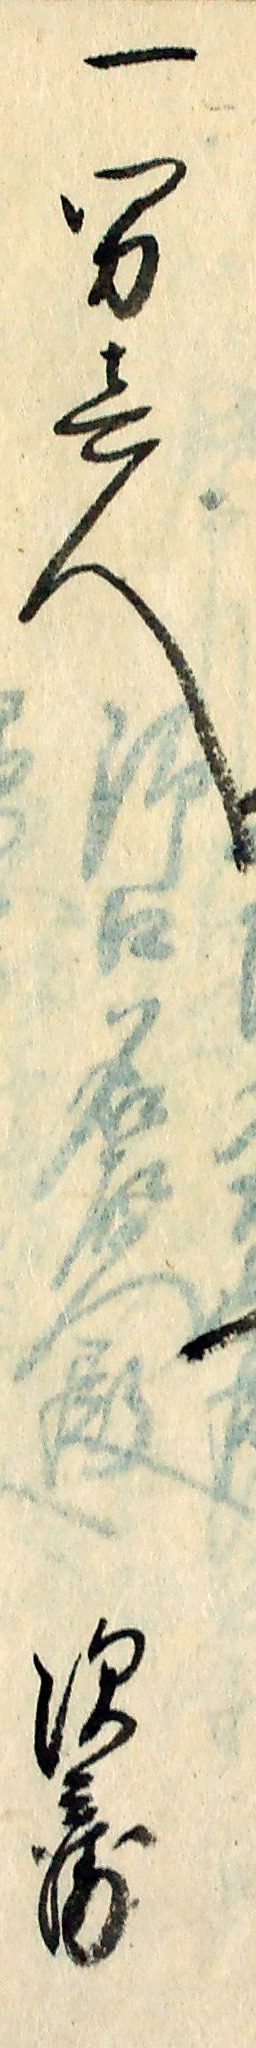一男壱人次兵衛
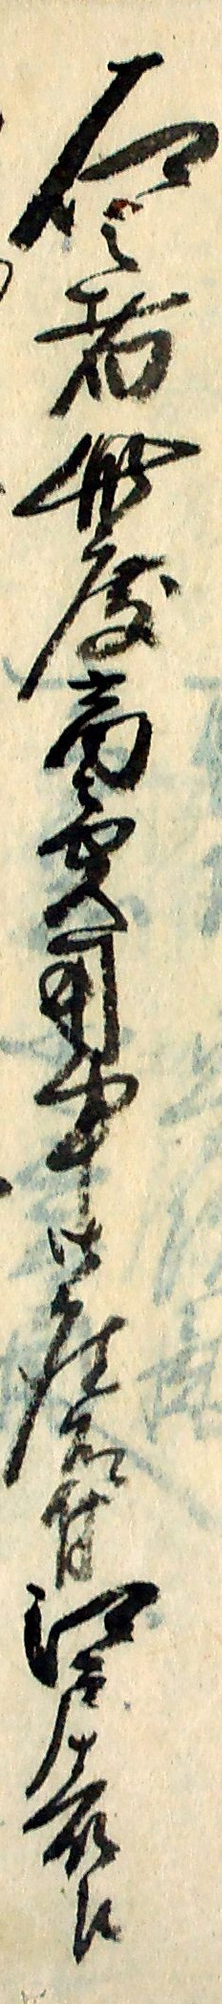右之者此度商売用事御座候に付江戸表え
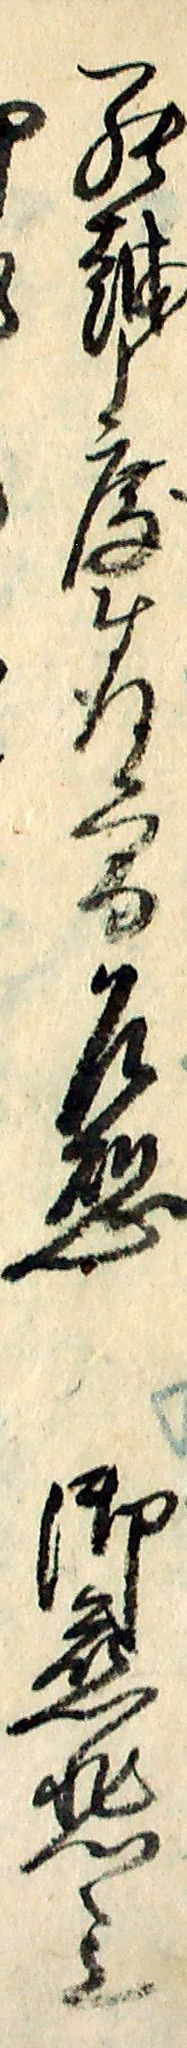罷越し度奉存候間乍恐御慈悲之上
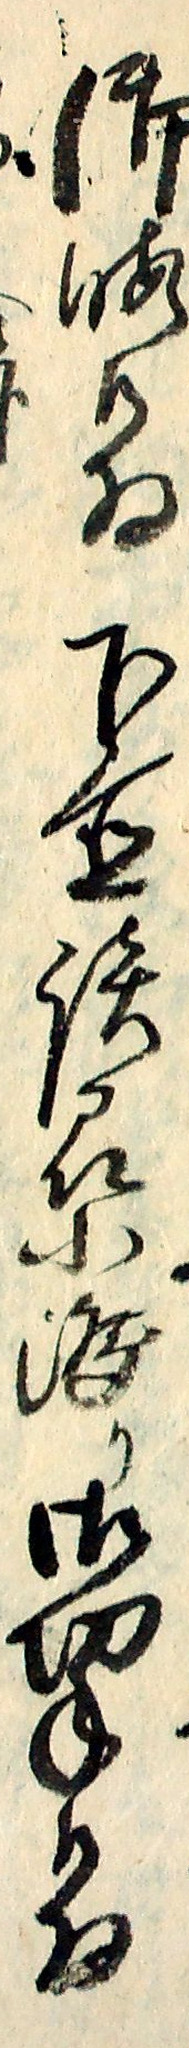御暇被為下置淡州小渡り御切手被為
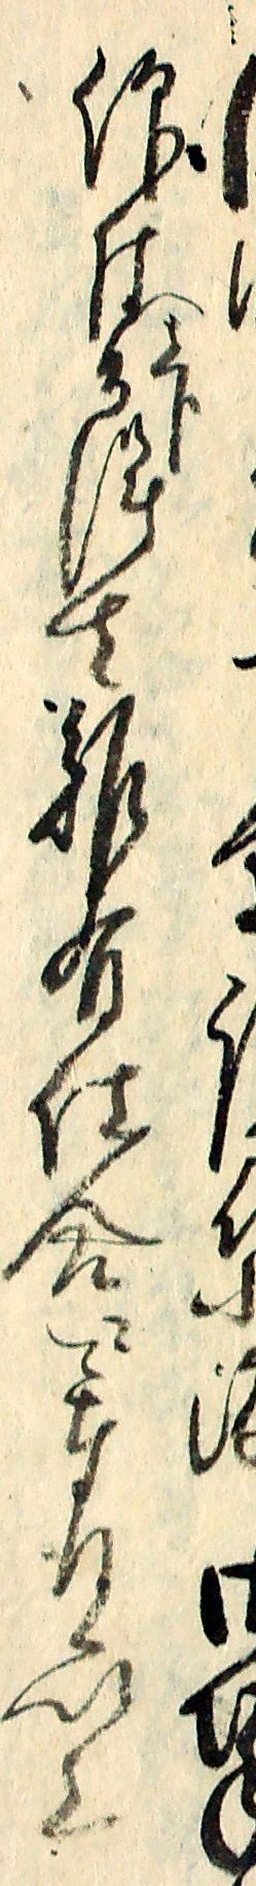仰付被下候得は難有仕合に可奉存候以上
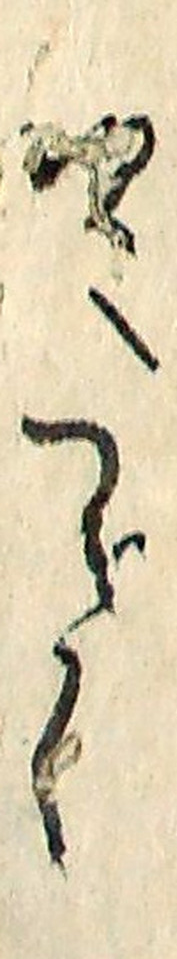次へつゞく

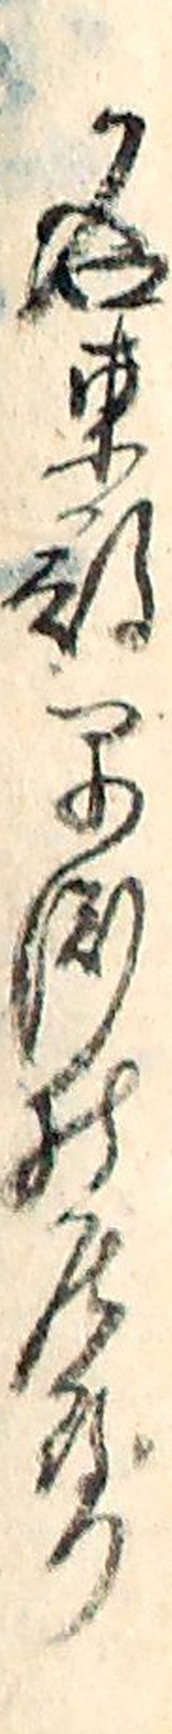名東郡早淵村庄屋
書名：諸御願書控(後藤氏壱番）
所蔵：鳴門教育大学 Naruto University of Education
